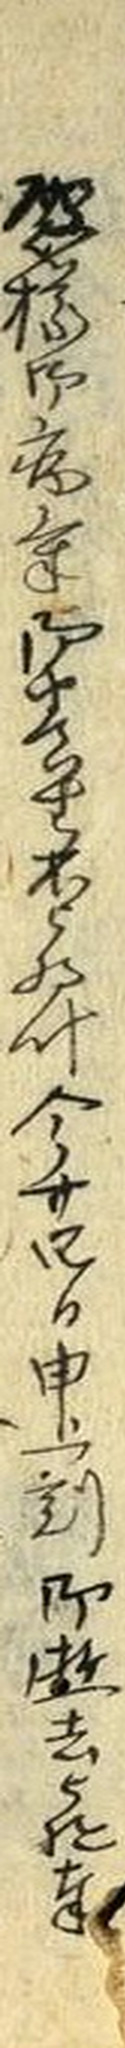殿様御病気御養生不被為叶今廿四日申上刻御逝去被遊奉
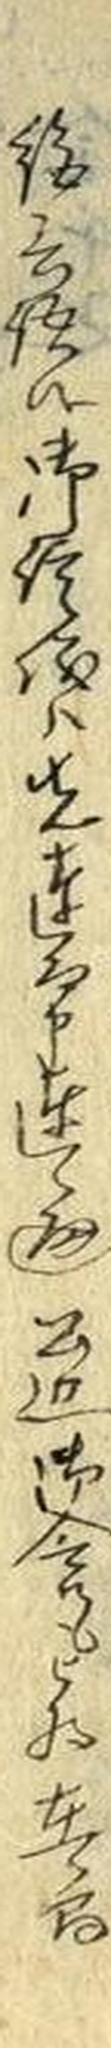絶言語候御仰候儀ハ先達而申達候通公辺御含も被為在候間
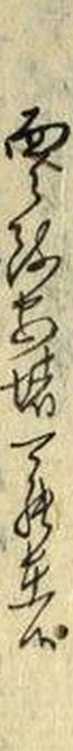面々致安堵可罷在候
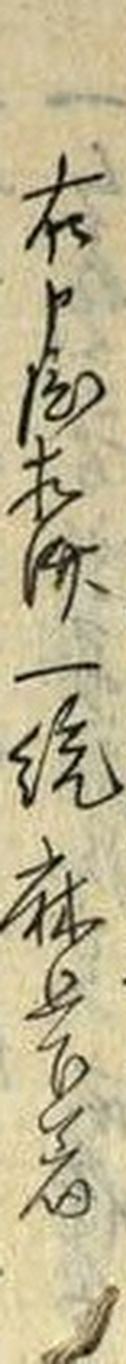右申渡相済一統麻上下着
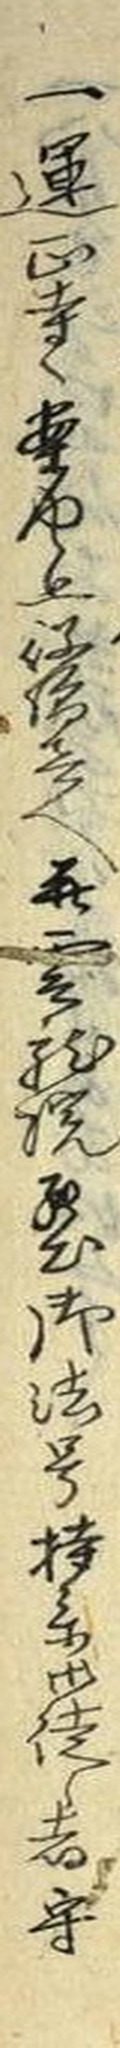一運正寺へ案内之上役僧壱人并雲龍院罷出御法号持参御徒之者守
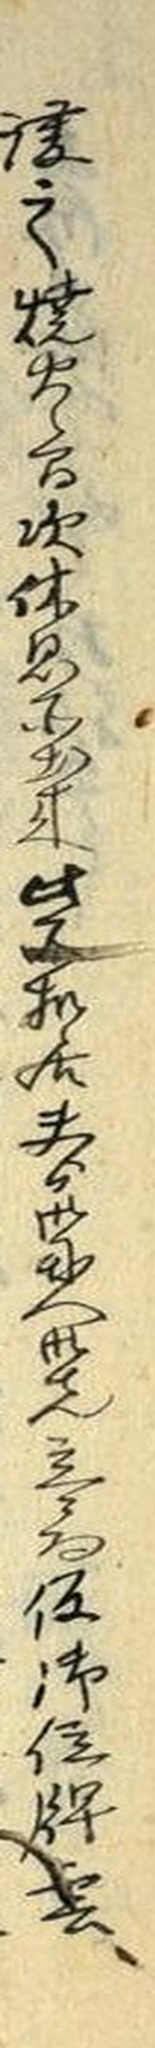護之焼火之間次休息所出来此所扣居夫ゟ御用人先立ニ而仮御位牌雲
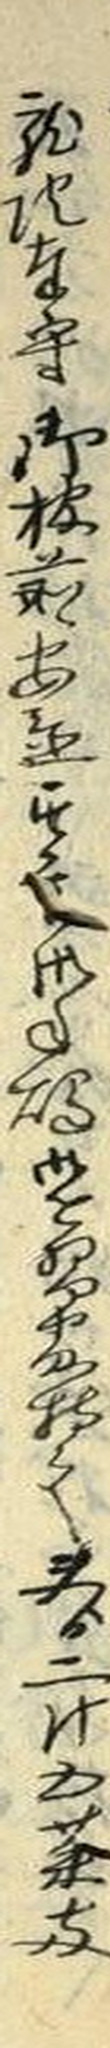龍院奉守御棺前へ安置其節御手燭御近習番持之夫ゟ二汁五菜両
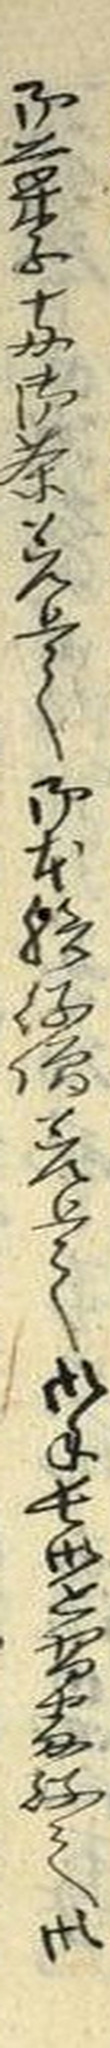御菓子両御茶差上之御本膳役僧差上之御手長御近習番役之御
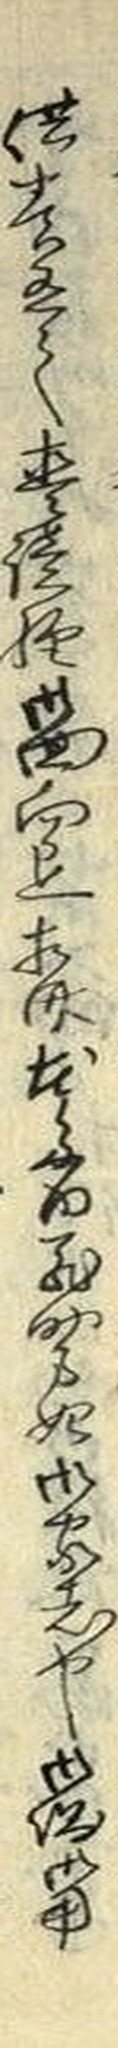供養有之直々読経御回向申上相済本多内蔵助方始御家老中御側御用
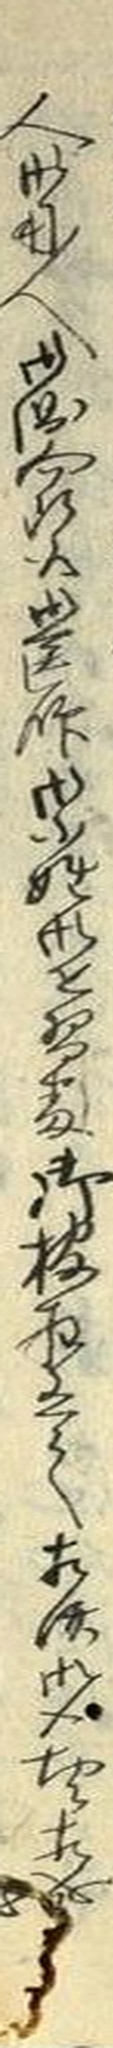人御用人御側向頭取御医師御小姓御近習番御棺拝有之相済御〆切ニ相成
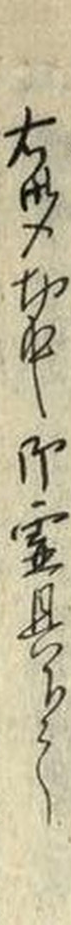右御〆切中御霊具下之
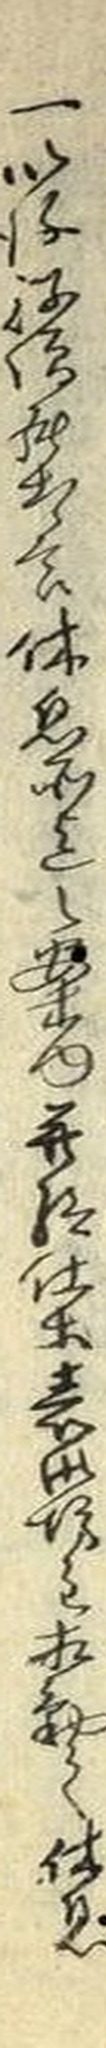一以後役僧罷出候節休息所迄之案内并給仕等表御坊主相勤之休息
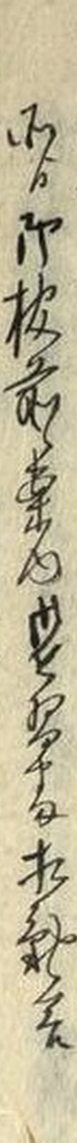所ゟ御棺前へ案内御近習番相勤候筈
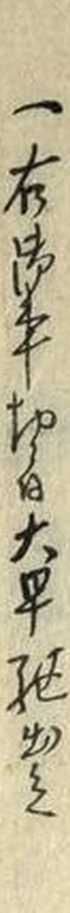一右御事切ニ付大早駆出立
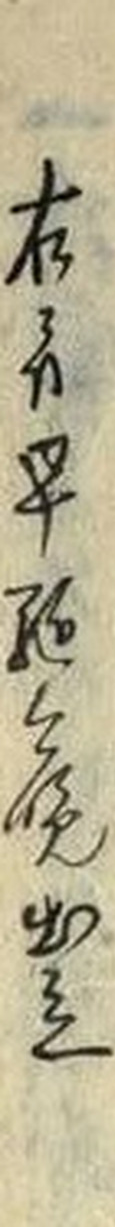右ニ付早駆今晩出立
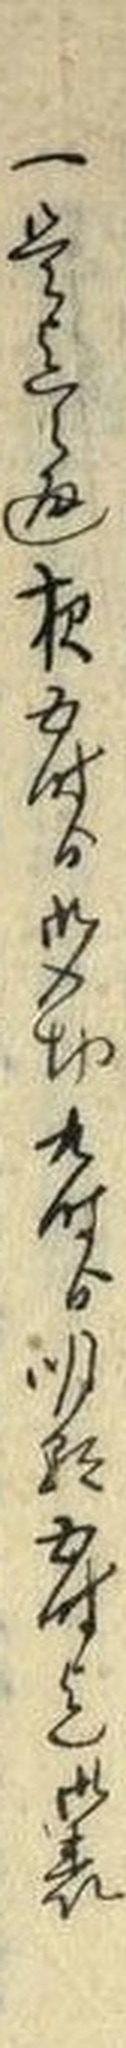一是迄之通夜五時ゟ御〆切九時ゟ明朝五時迄御表
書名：少傅日録抄（斉善付側向頭取日記、江戸并道中、初入在国、逝去後…
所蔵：福井県文書館 Fukui Prefectural Archives
